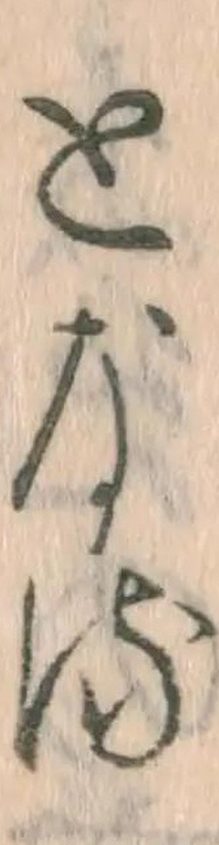となる
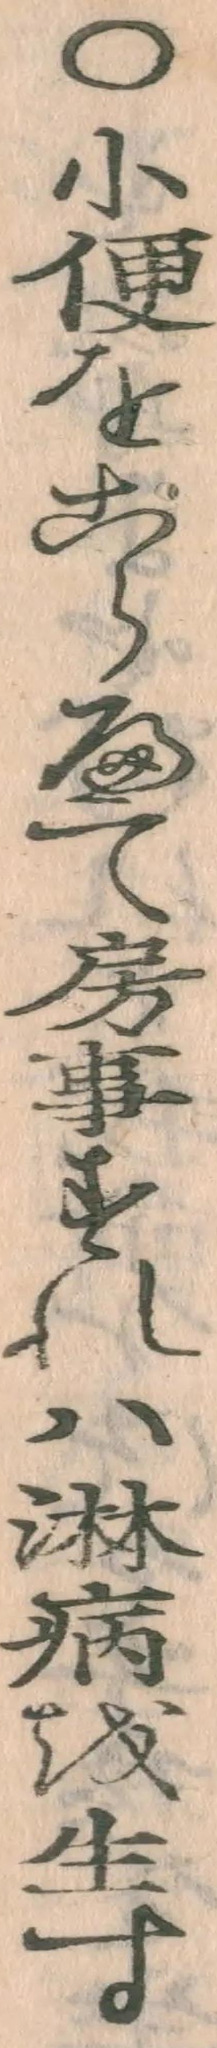〇小便をこらへて房事すれは淋病を生す
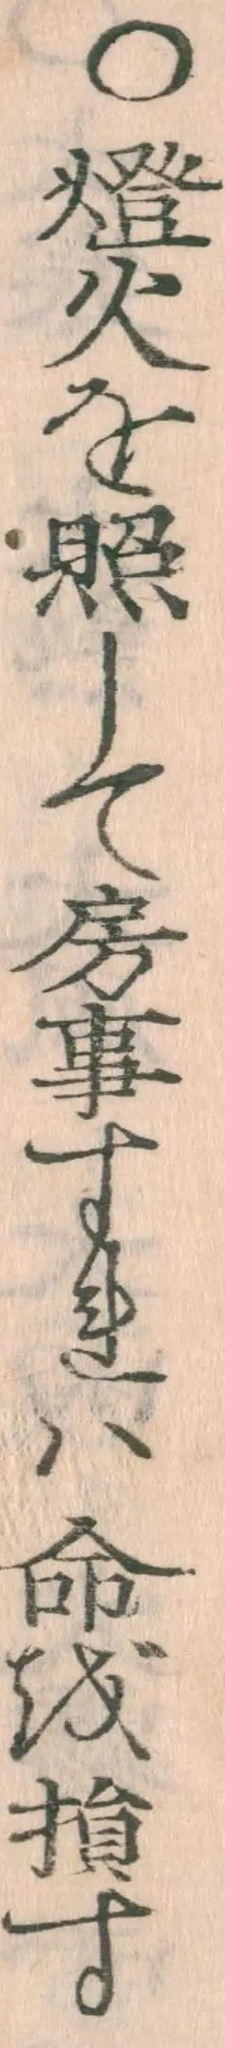〇灯火を照して房事すれは命を損す
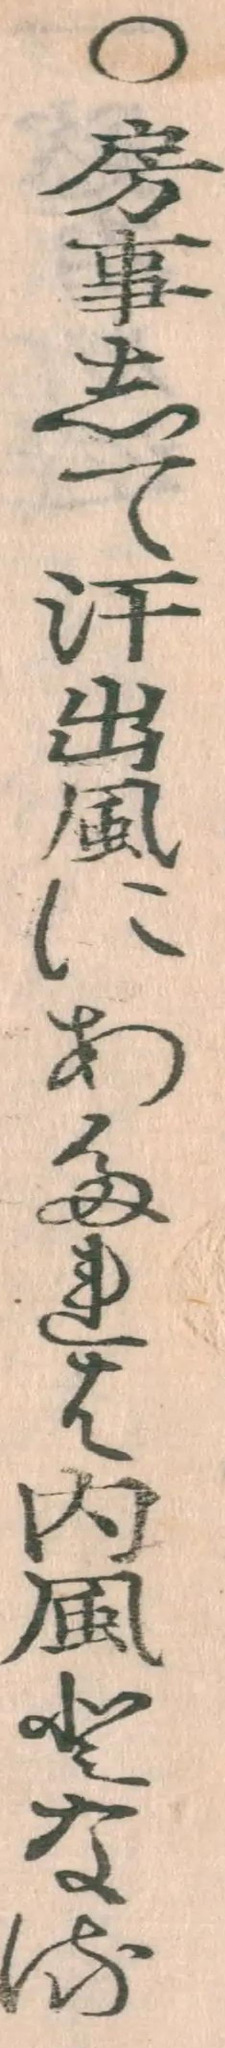〇房事して汗出風にあたれは内風となる
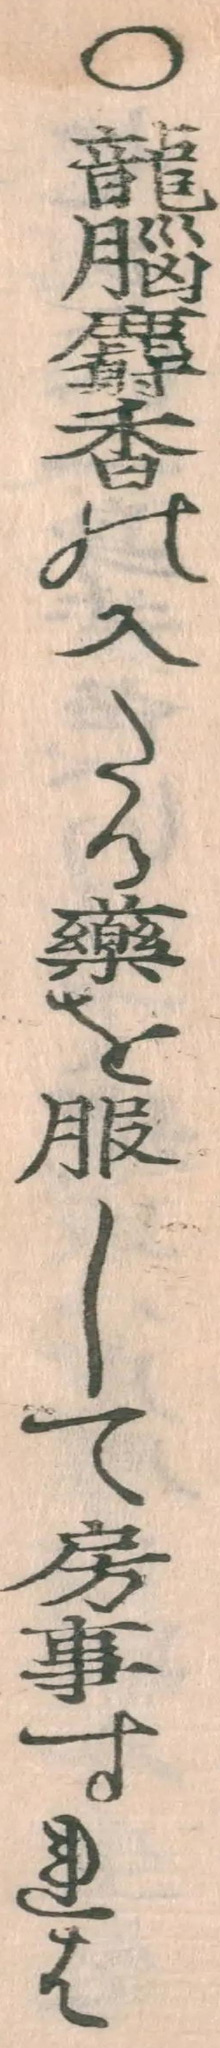〇竜能麝香の入たる薬を服して房事すれは
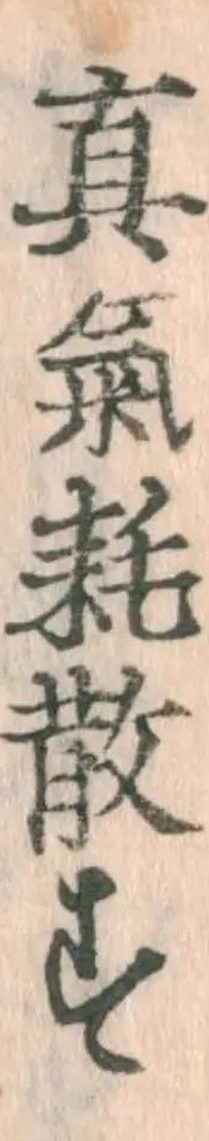真気耗散す
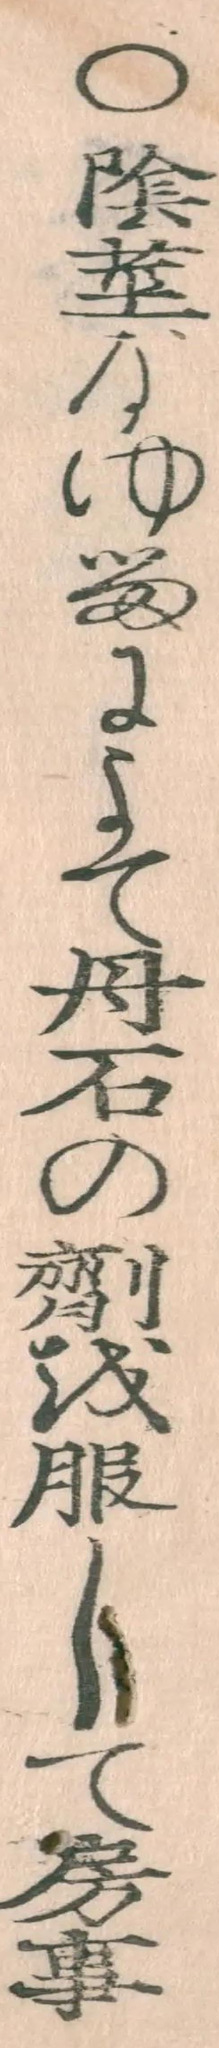〇陰茎なゆるによて丹石の剤を服して房事
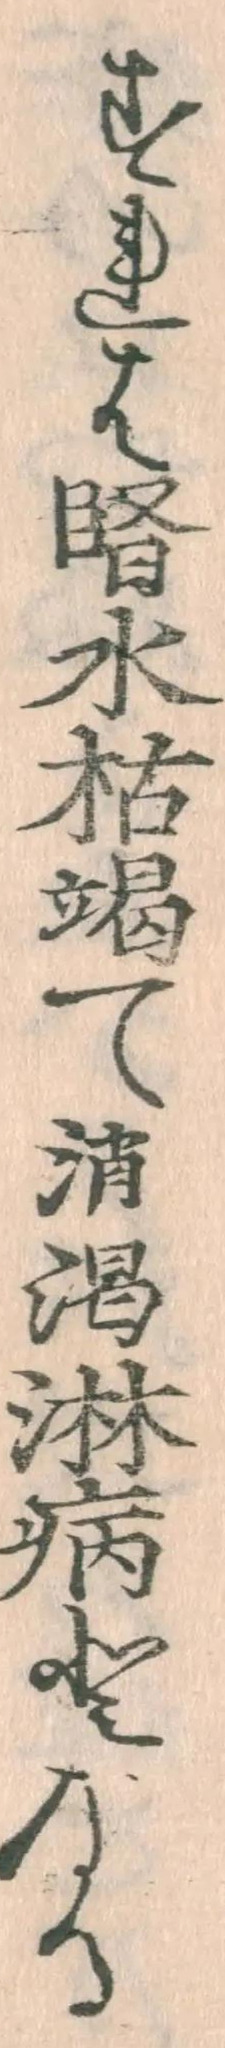すれは腎水枯竭て消渇淋病となるみず
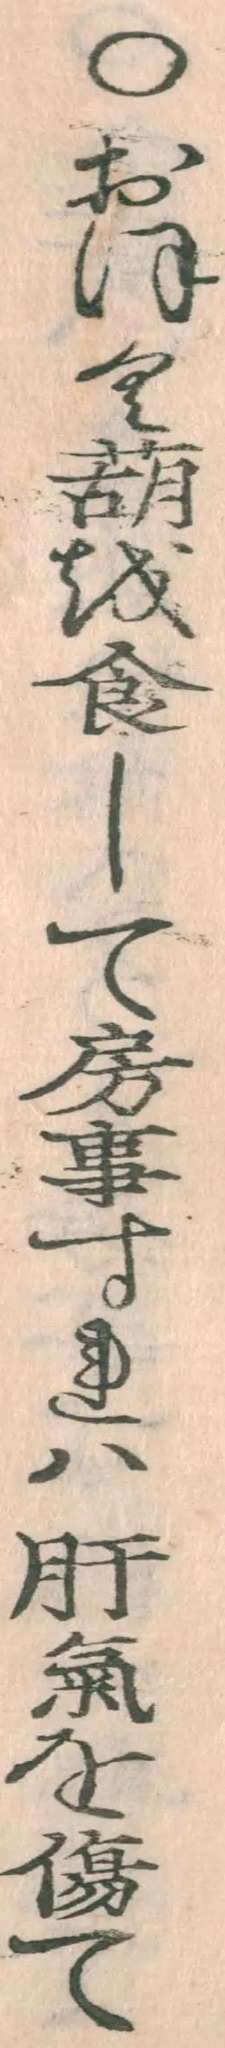〇おほく葫を食して房事すれは肝気を傷て
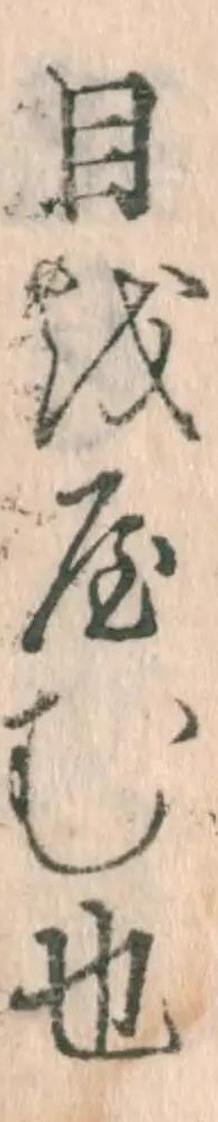目をやむ也
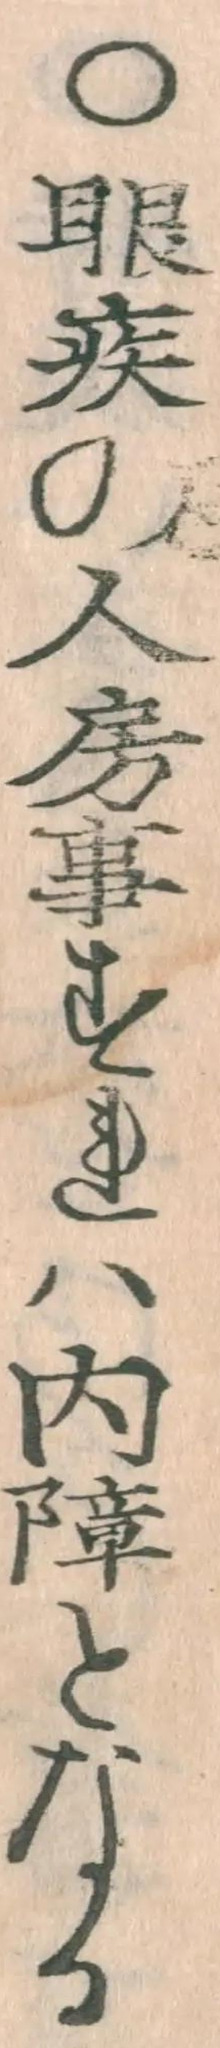〇眼疾の人房事すれは内障となる

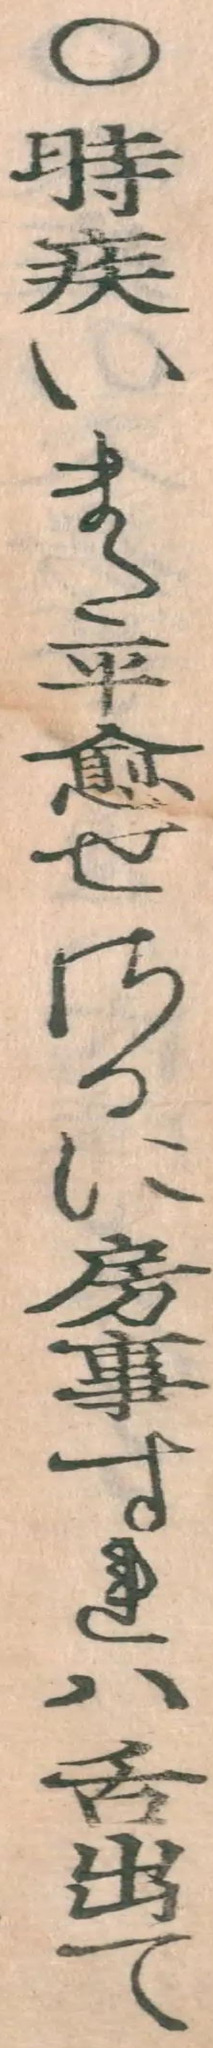〇時疾いまた平愈せさるに房事すれは舌出て
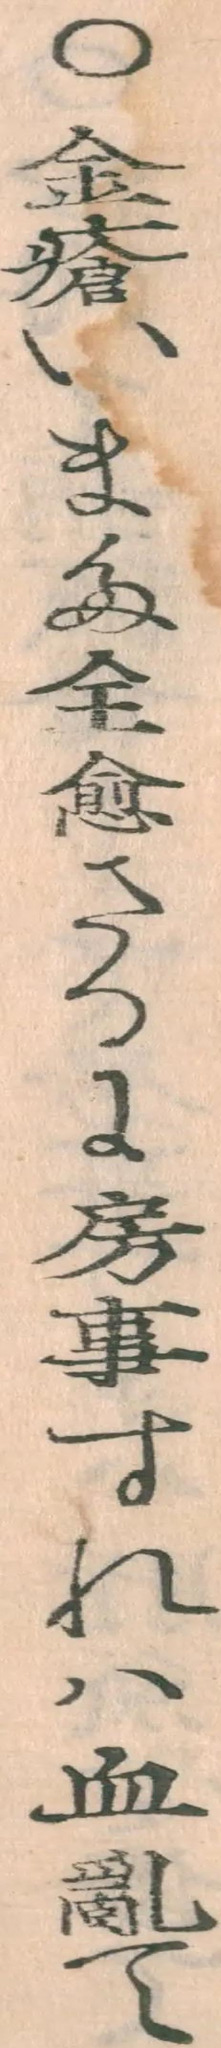〇金瘡いまた全愈さるに房事すれは血乱て
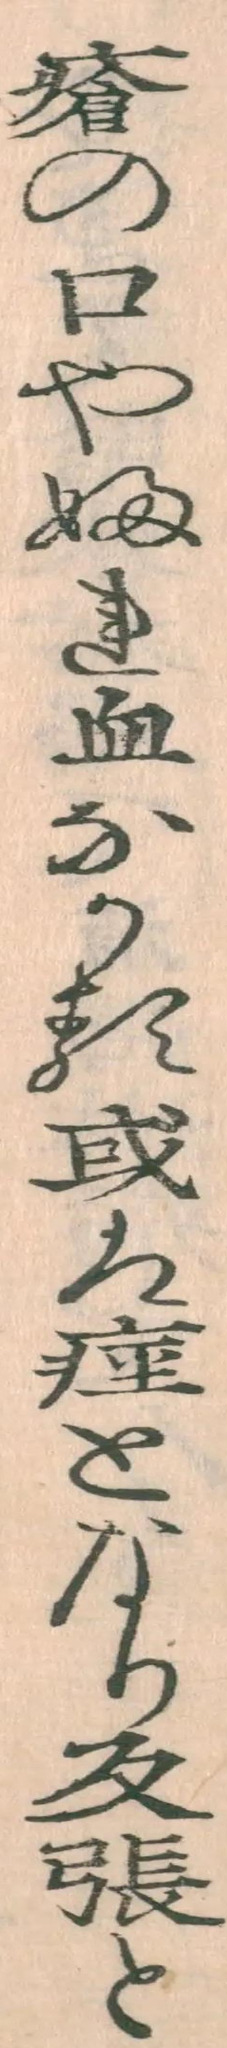瘡の口やふれ血なかる或はとなり反張と
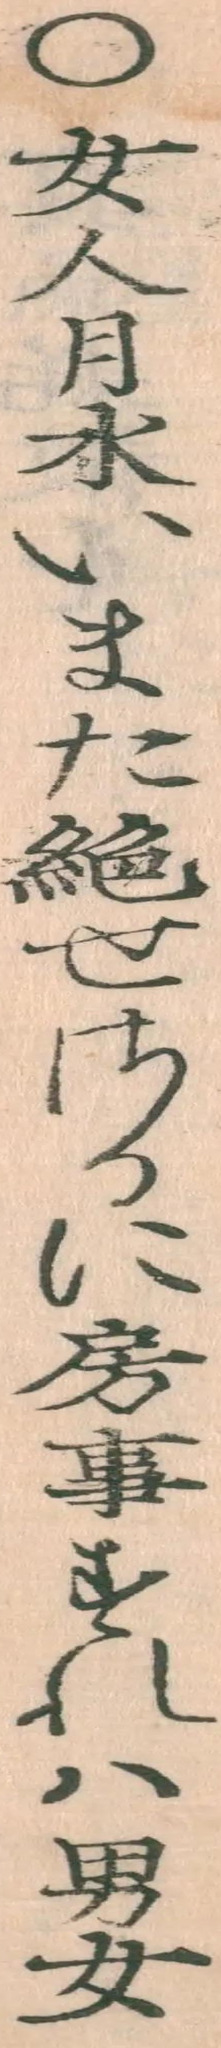〇女人月水いまた絶せさるに房事すれは男女
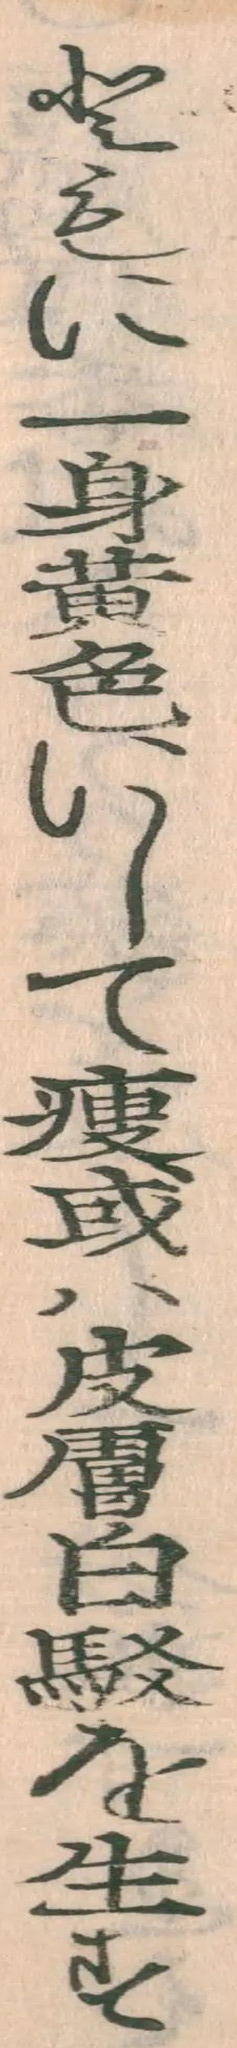ともに一身黄色にして痩或は皮膚白駁を生す
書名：延壽撮要
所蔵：国立国会図書館 National Diet Library, JAPAN
